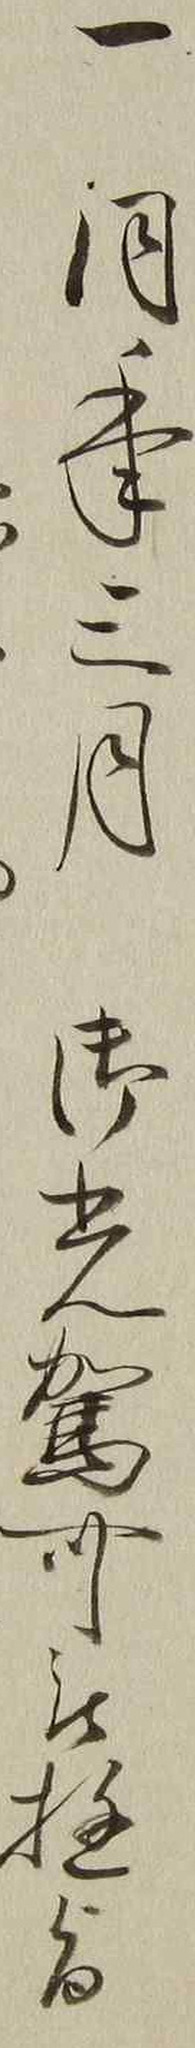一同年三月御光駕可被遊旨
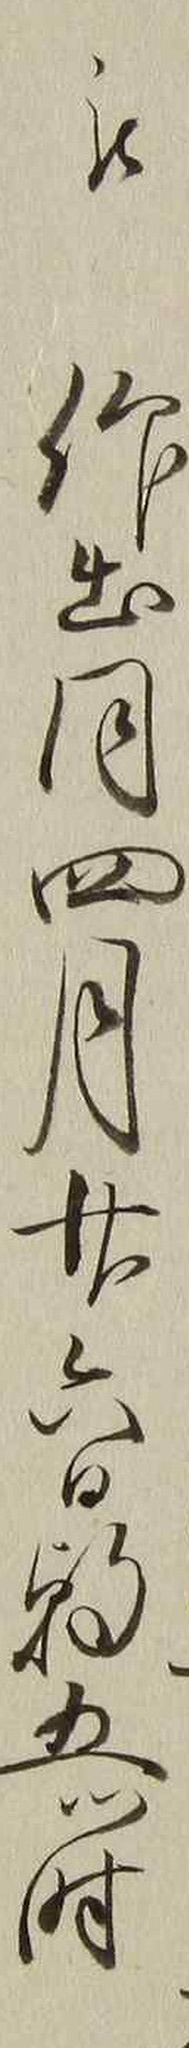被仰出同四月廿六日朝五ツ時
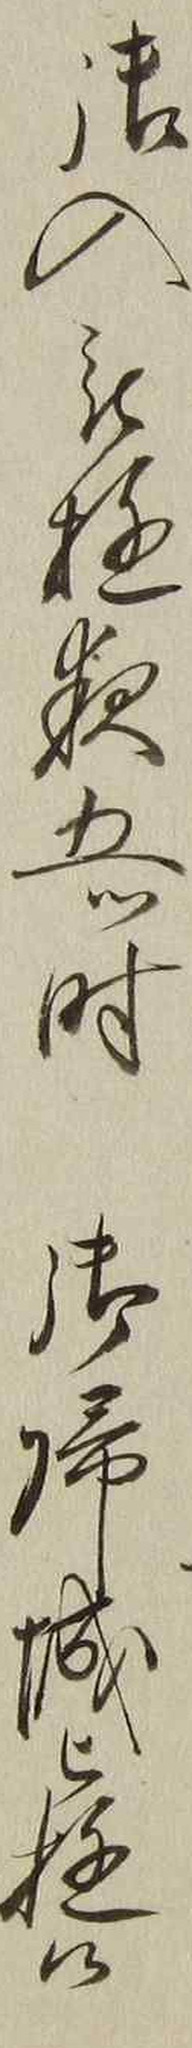御入被遊夜五ツ時御帰城被遊候
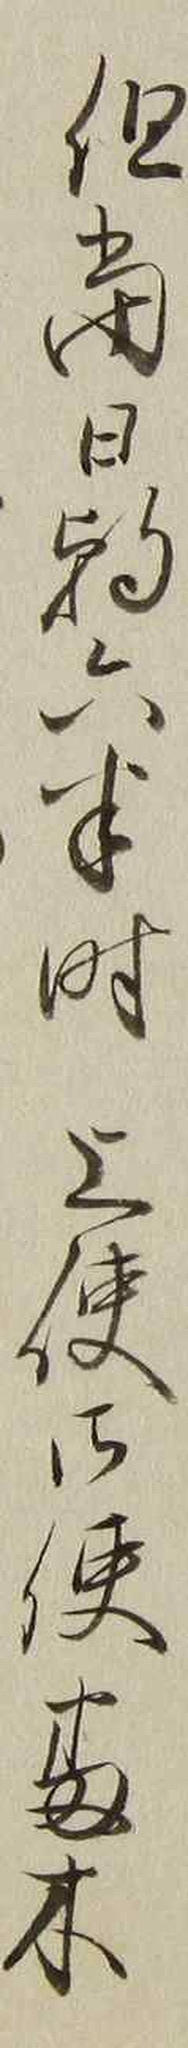但当日朝六半時上使御使番木
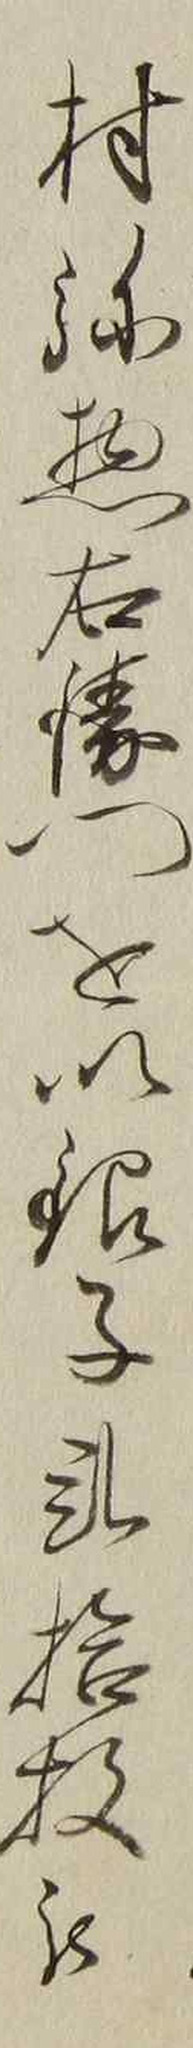村弥惣右衛門を以銀子弐拾枚被
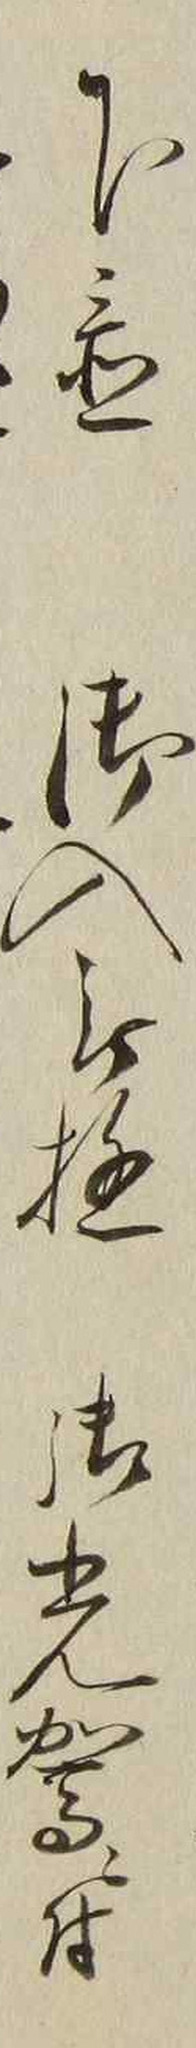下置御入被遊御光駕に付
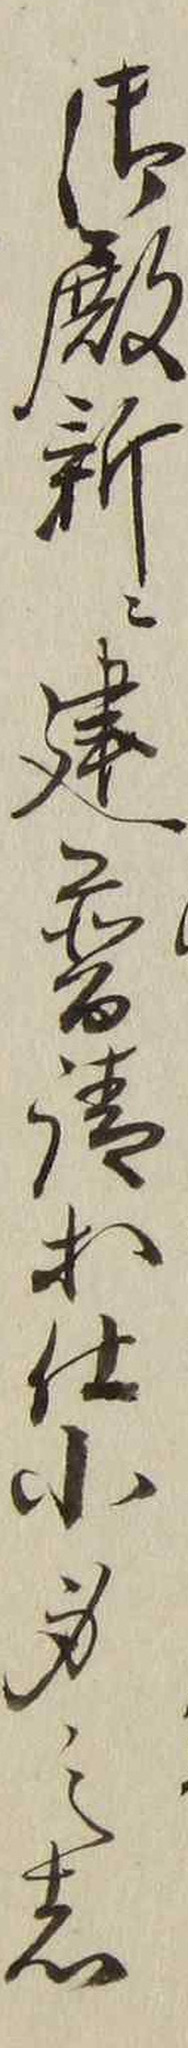御殿新に建普請等仕小身之者
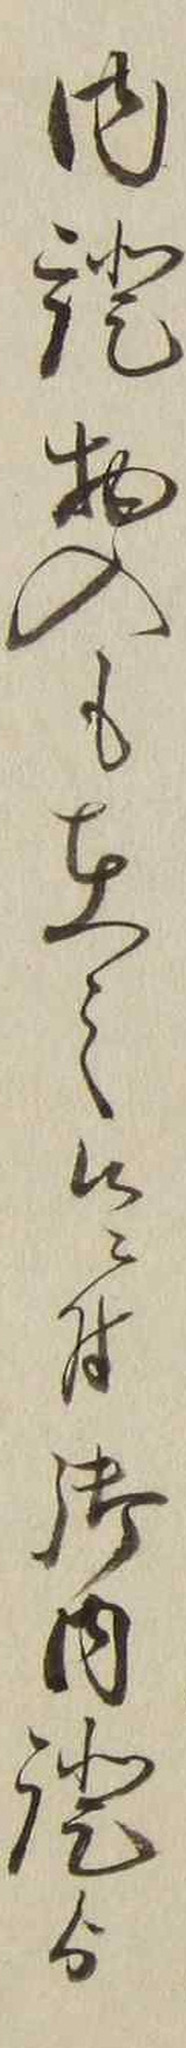内証物入も在之候に付御内証ゟ

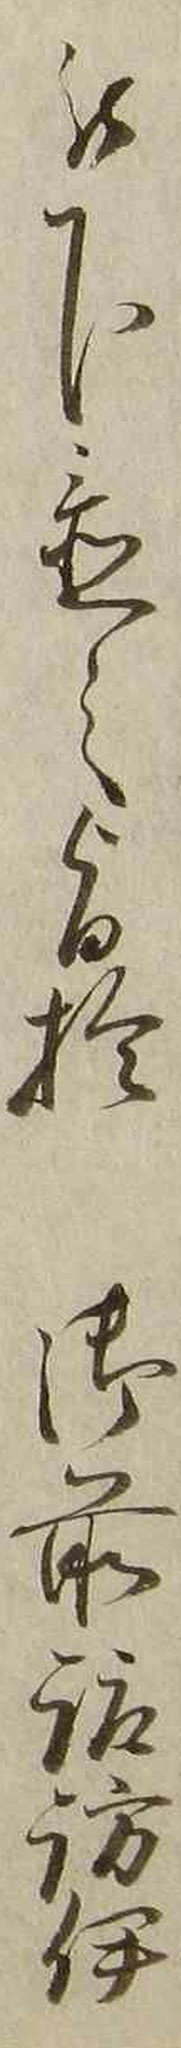被下置之旨於御前諏訪伊
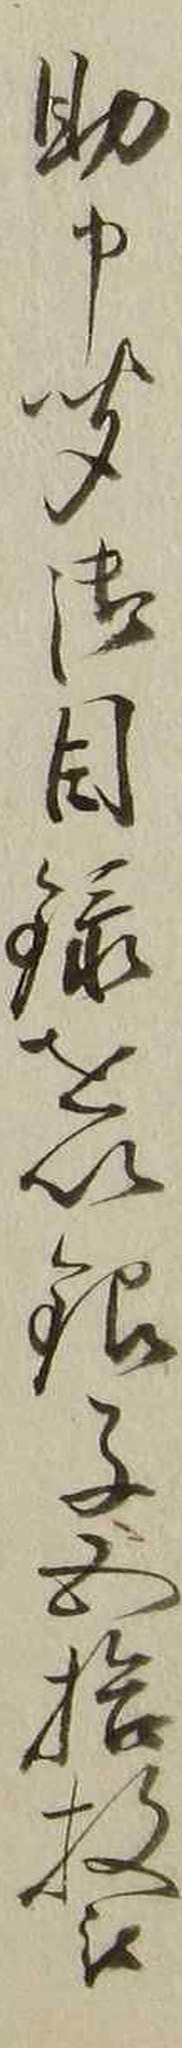助申聞御目録を以銀子五拾枚被
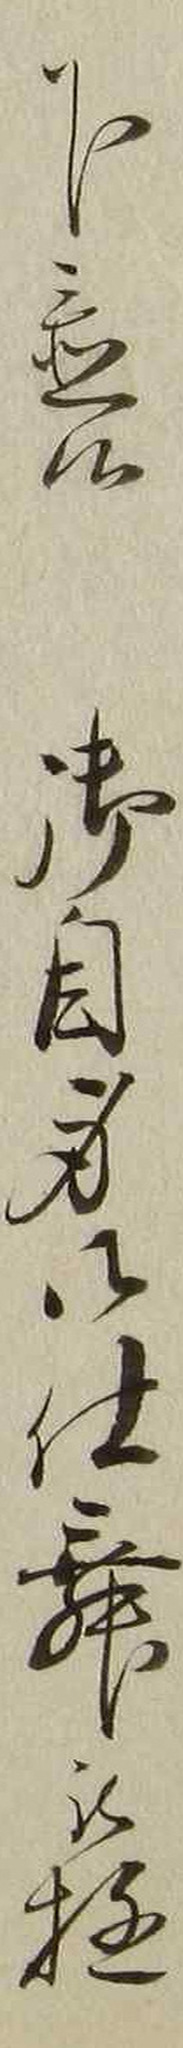下置候御自身御仕舞被遊
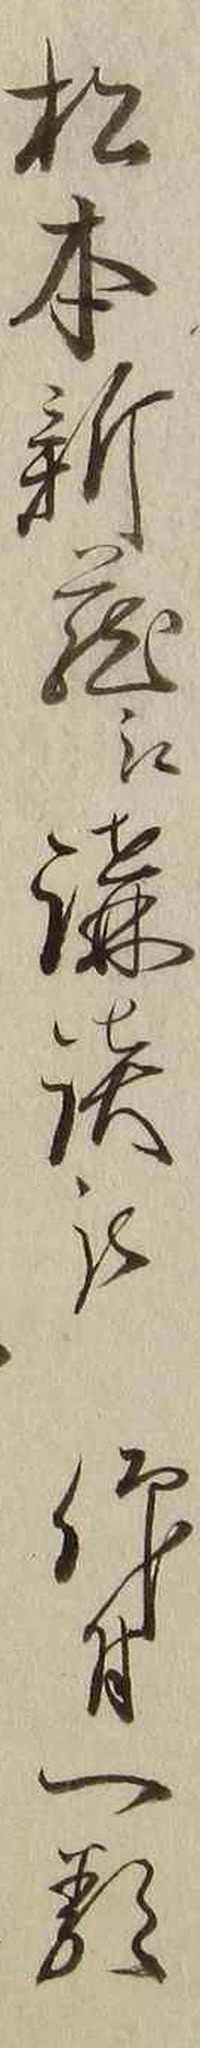松本新蔵江講談被仰付一類
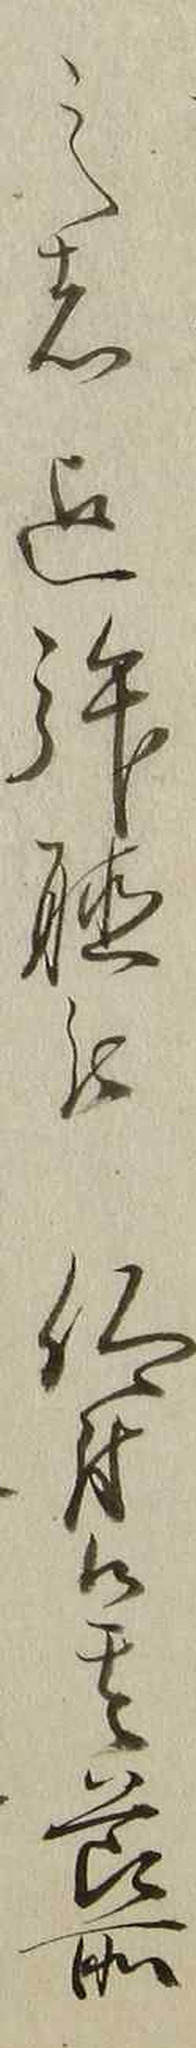之者迄拝聴被仰付候其節所
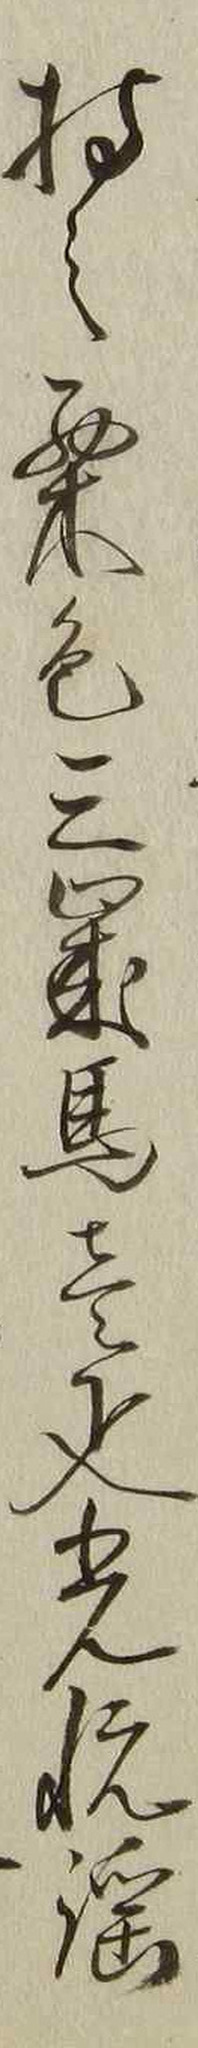持之栗色三歳馬壱疋光悦謡
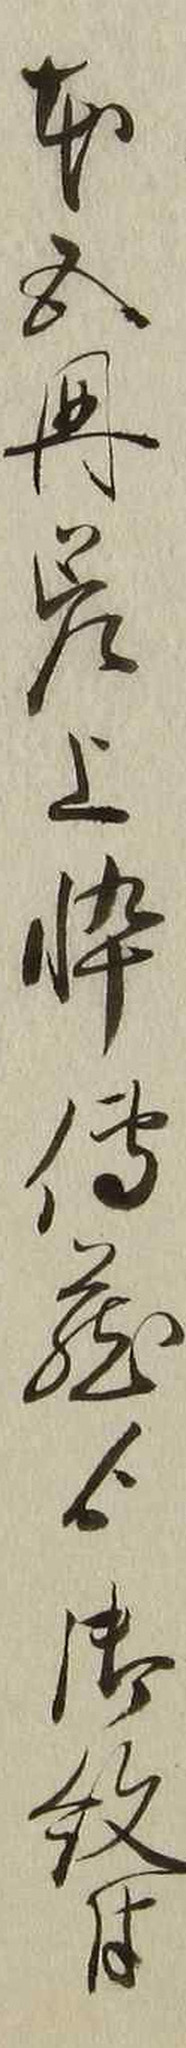本五冊差上忰伝蔵ゟ御紋付
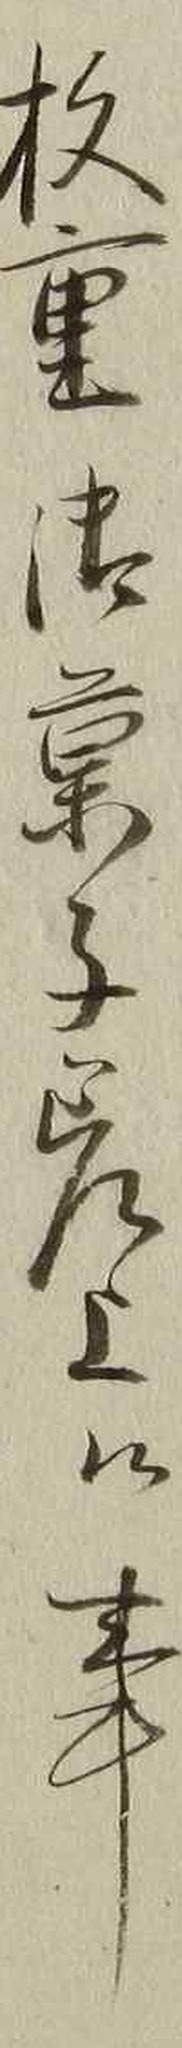枚重御菓子差上侯事
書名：諸士系譜　巻之103　か之部11
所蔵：会津若松市立会津図書館
